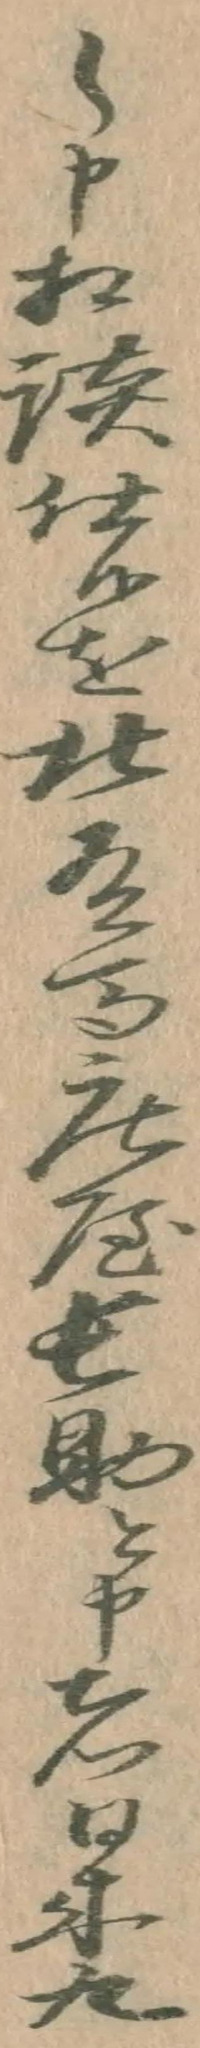し申相談仕候を北有馬庄屋長助と申者日来九
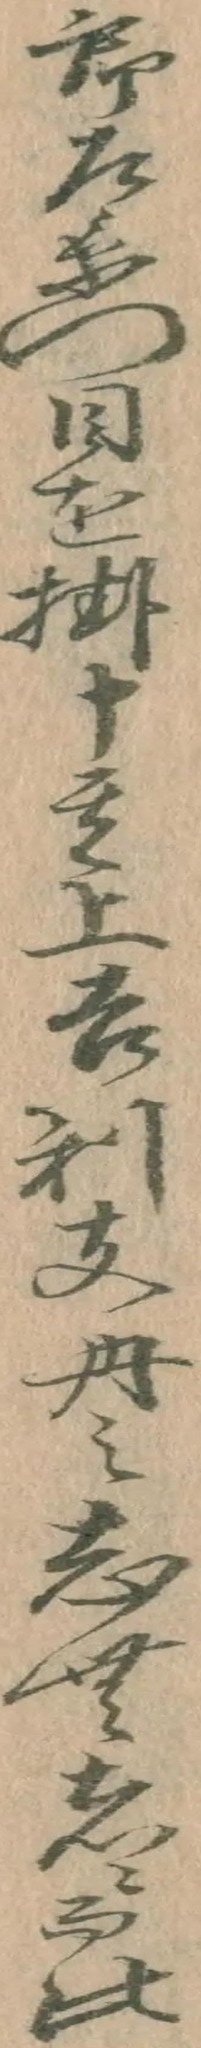郎左衛門目を掛申其上吉利支丹之志無者に而此
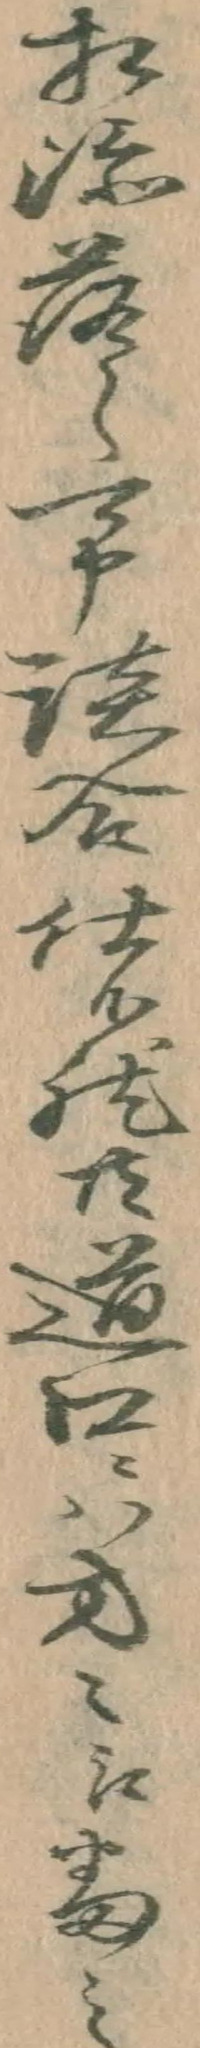相添落し可申談合仕候然共道口には方々え番之
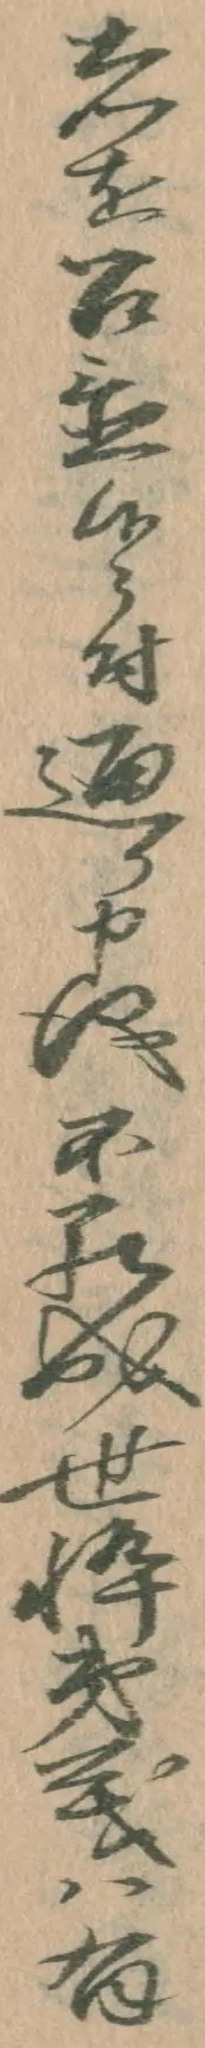者を召置候に付通り申儀不罷成世倅弟義は有
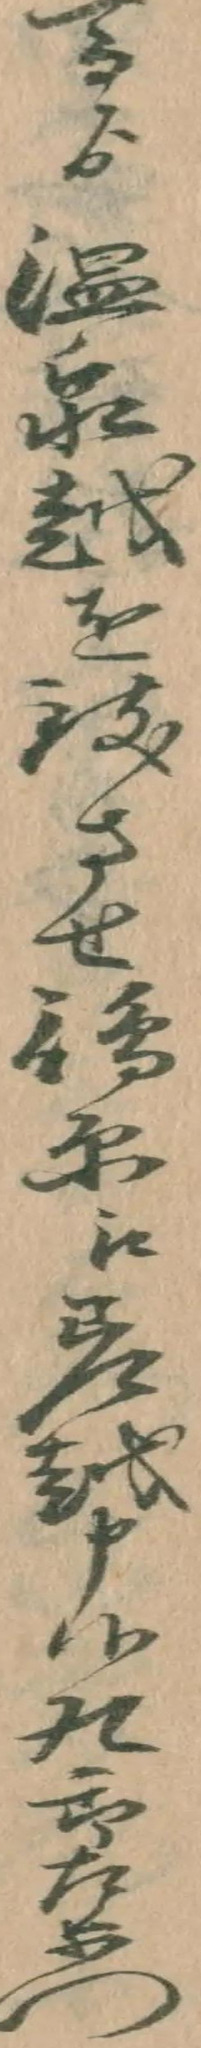馬ゟ温泉越を致させ島原え差越申候九郎左衛門
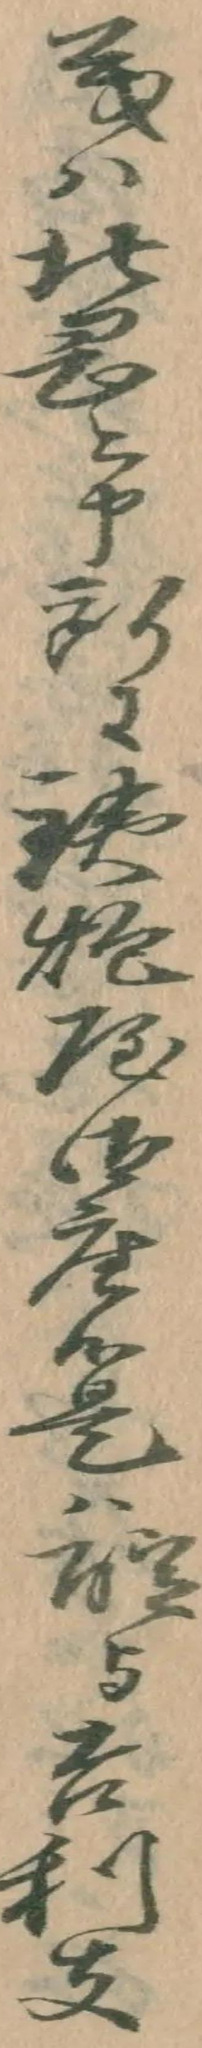義は北岡と申所に鉄炮屋御座候是は聢与吉利支
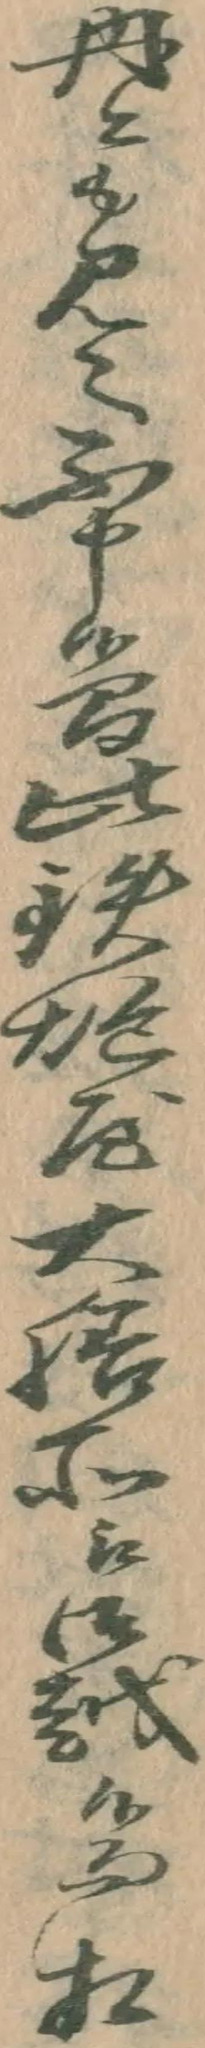丹とも見に不申候間此鉄炮屋大膳所え御越候而相
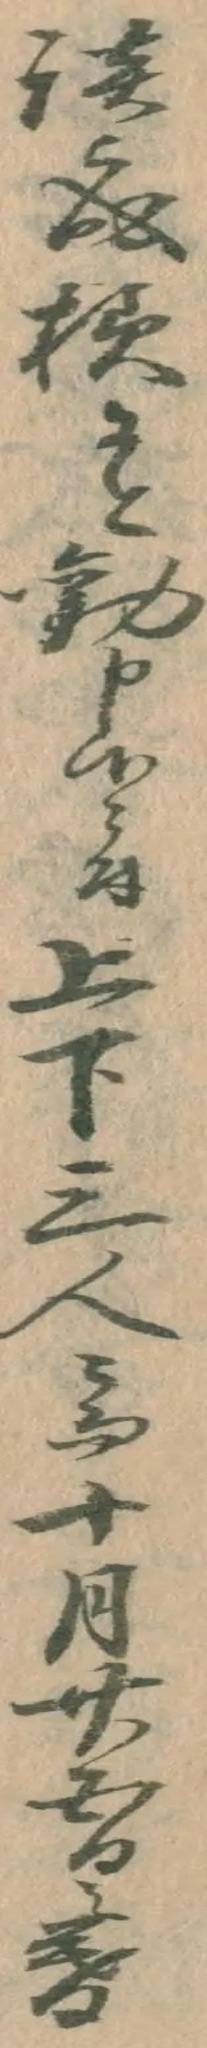談被成様にと勤申候に付上下三人に而十月廿五日之暮
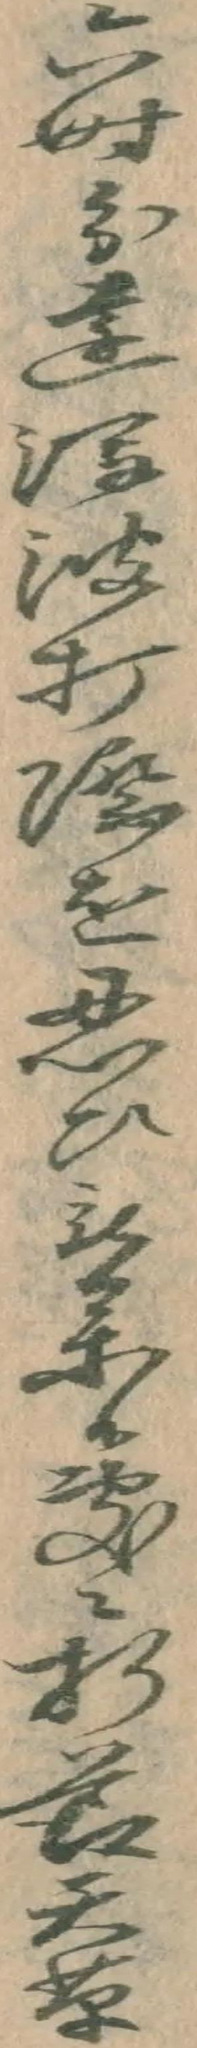六時分遠潟波打際を忍ひ被参候処に折節天草
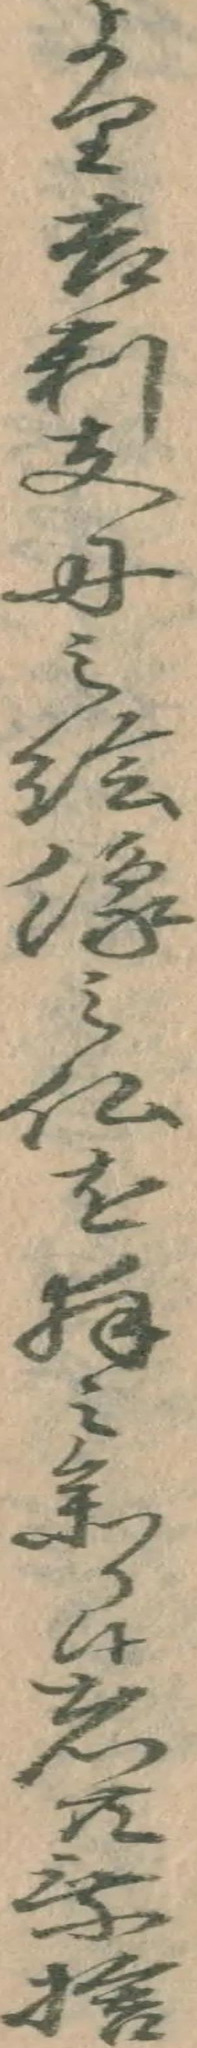より吉利支丹之絵像之仏を拝み参り候者共乗捨
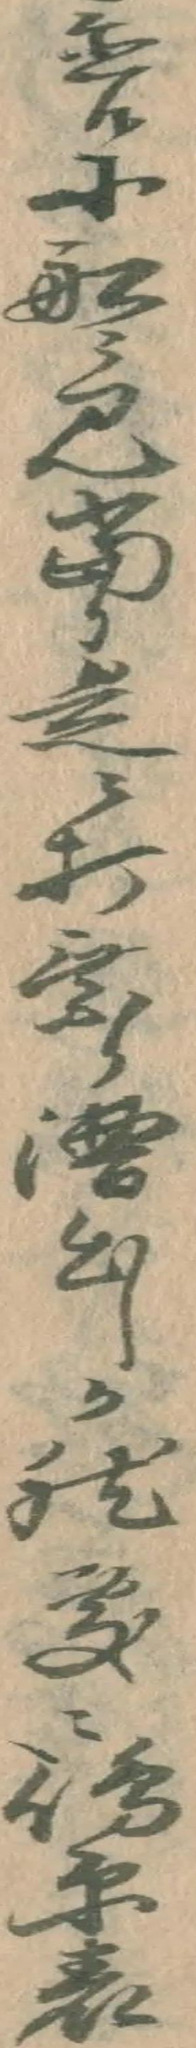置候小船に見当り是に打乗り漕出しか然処に島原表
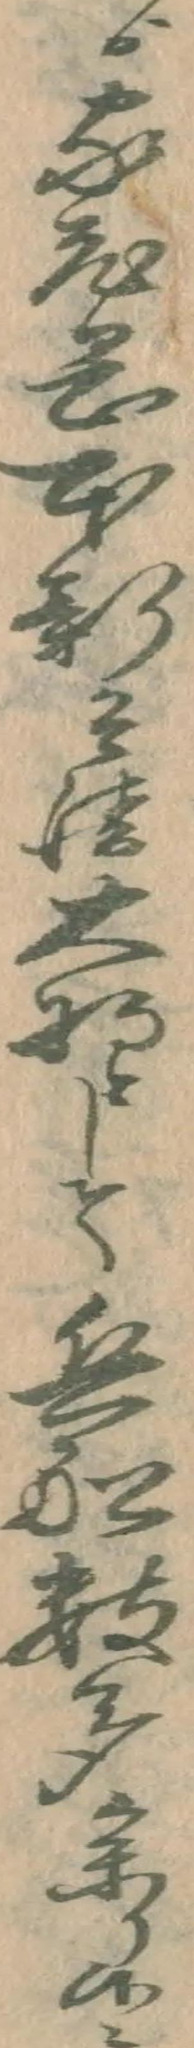ゟ家老岡本新兵衛大将として兵船数多参り候に
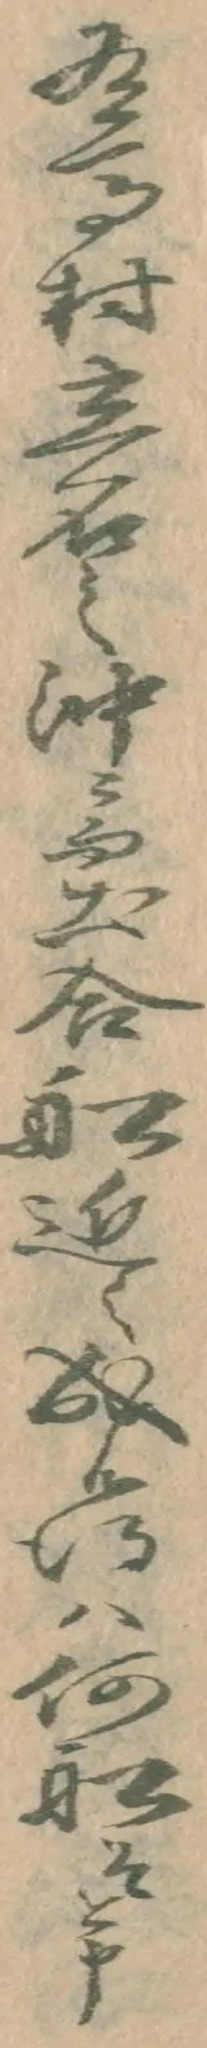有馬村立石之沖に而出合船近く成候得は何船そと申
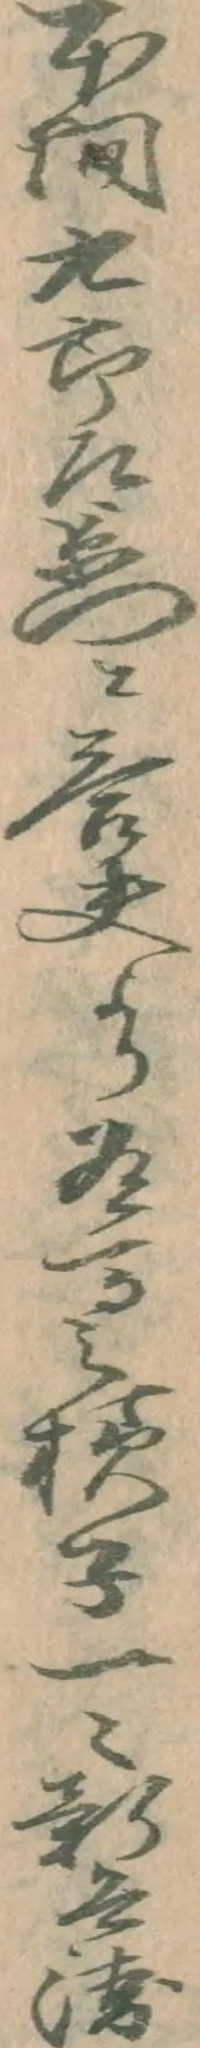本間九郎左衛門と答夫より有馬之様子一々新兵衛

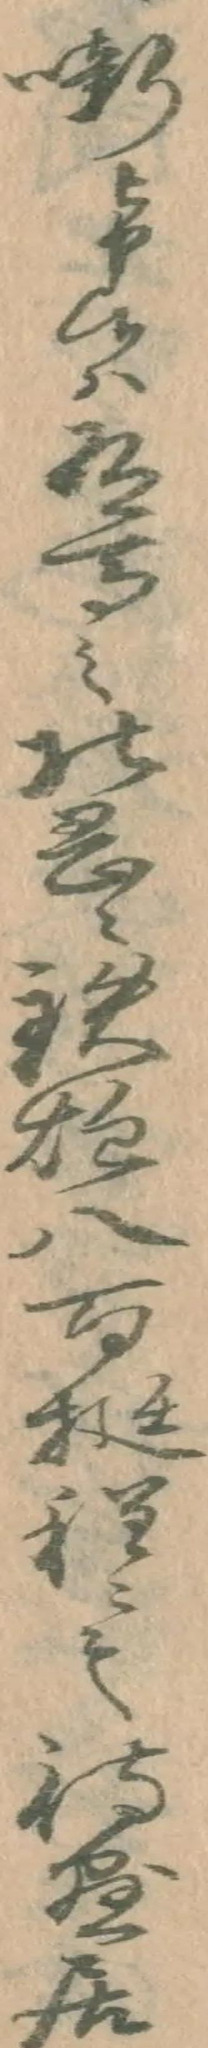に噺被申候は有馬之北岡に鉄炮八百挺程にて侍懸居
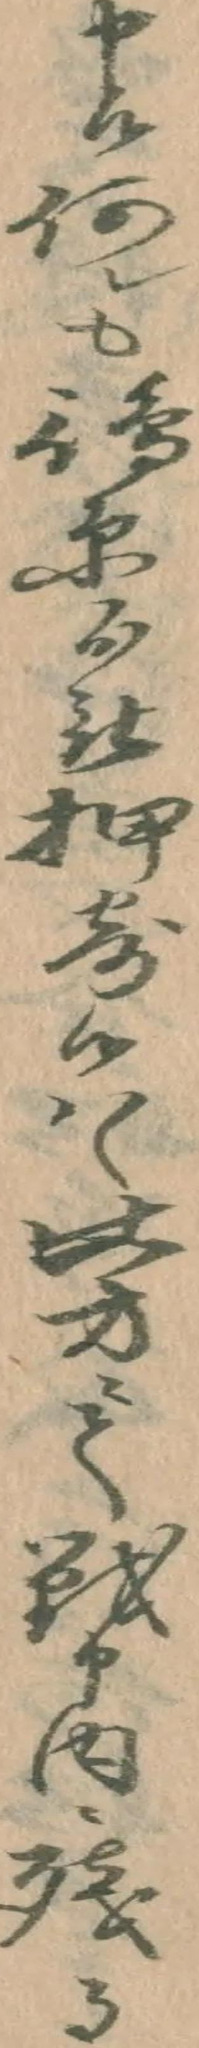申候何れも島原ゟ被押寄候はゝ此方にて戦申内に残る
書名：切支丹御退治記 49巻. [1]
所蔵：国立国会図書館 National Diet Library, JAPAN
